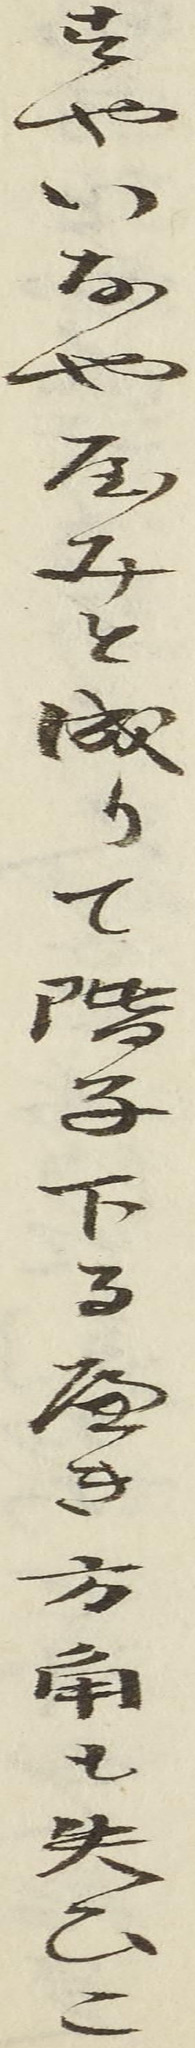すやいなややみと成りて階子下るへき方角も失ひこ
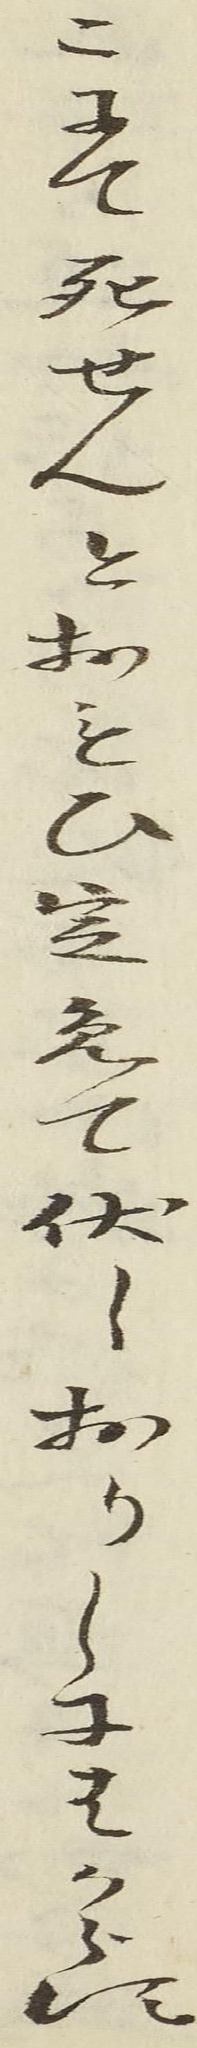こにて死せんとおもひ定めて伏しおりしにはからす
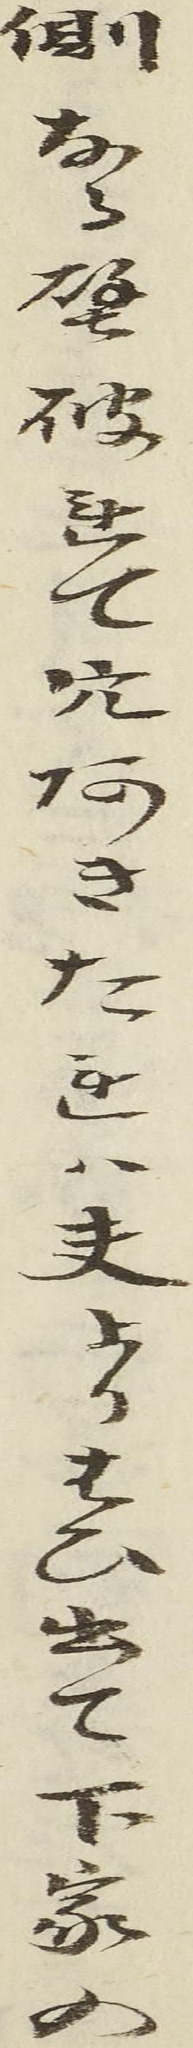側なる壁破れて穴あきたれハ夫よりはひ出て下家の

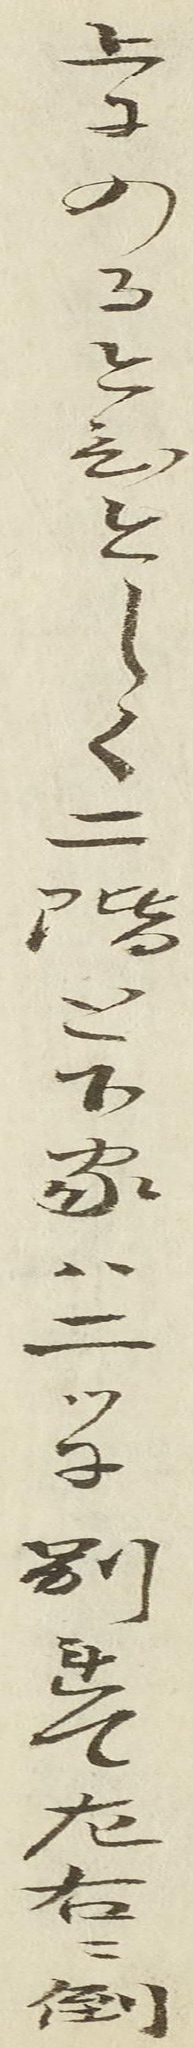上にのるとひとしく二階と下家は二ッに別れて左右二倒
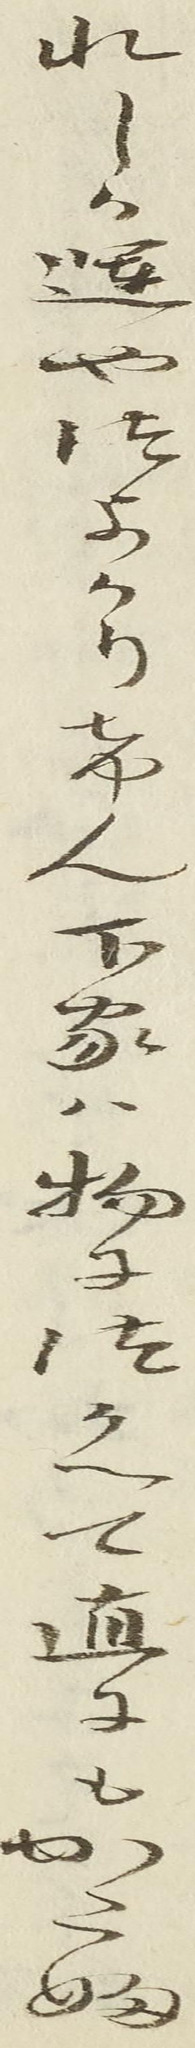れしか運やつよかりけん下家ハ物につかへて直にもかたふ
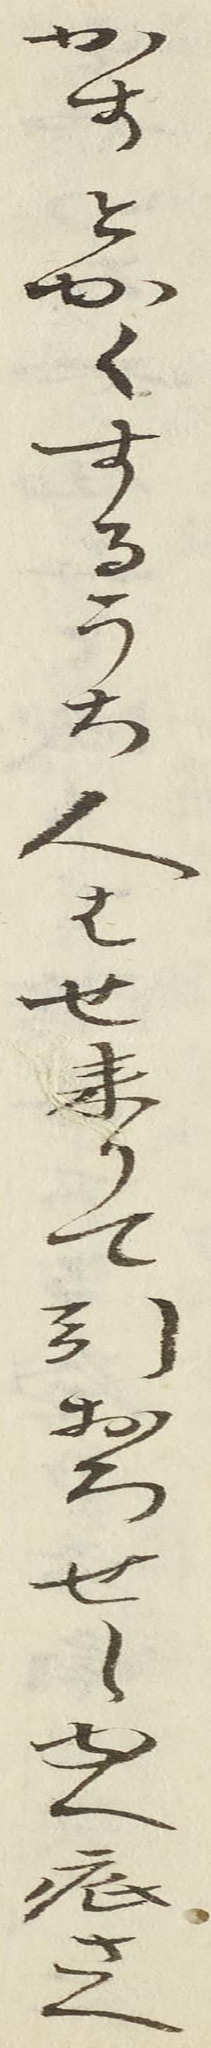かすとかくするうち人はせ来りて引おろしゆへ疵さへ
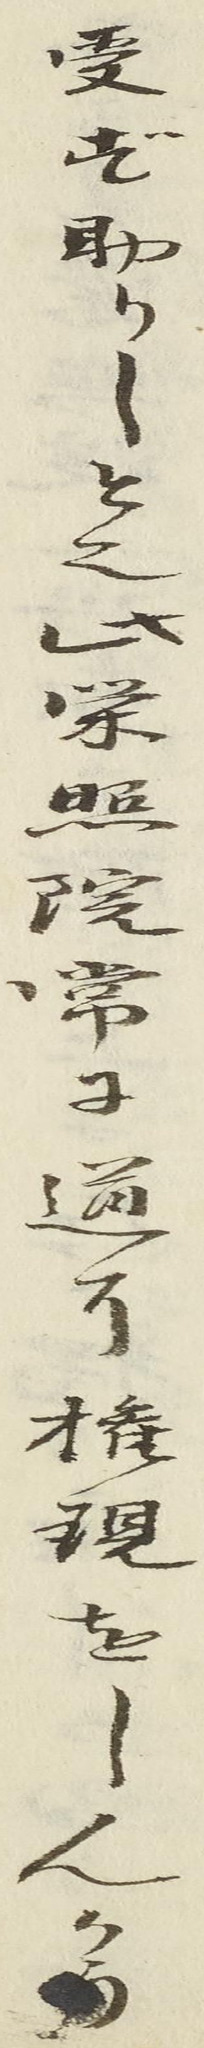受ず助りしと也此栄照院常に道了権現をしんかう
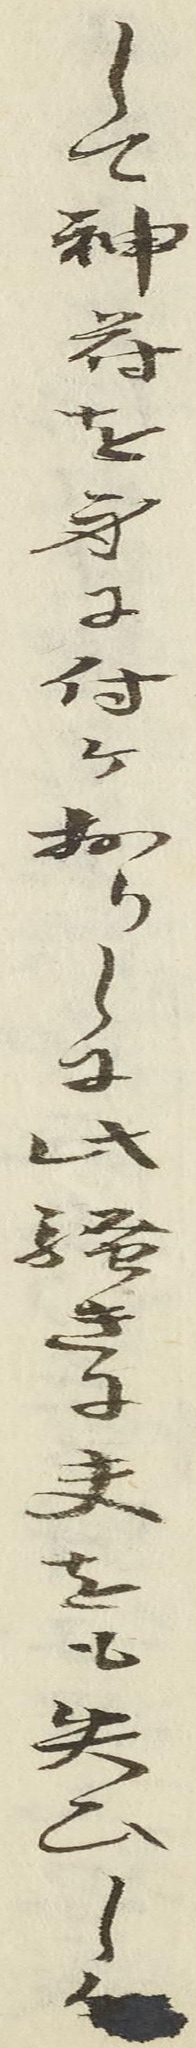して神符を身に付ヶおりしに此騒きに夫をも失ひしか
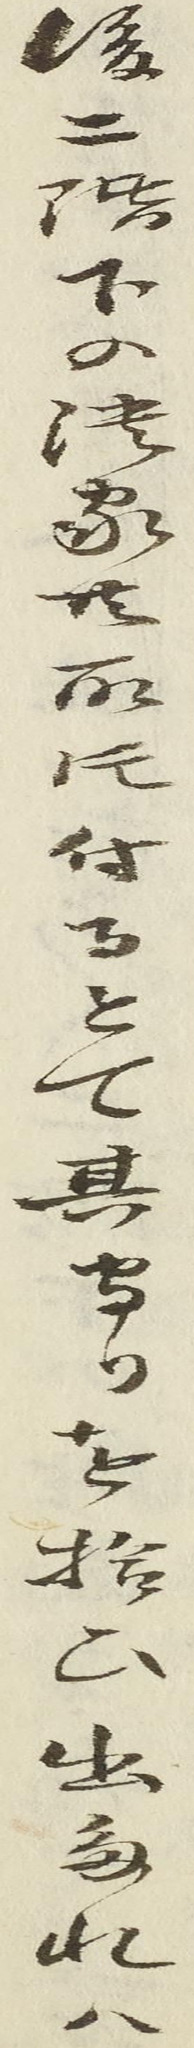後二階下の潰家共取片付るとて其守りを拾ひ出たれハ
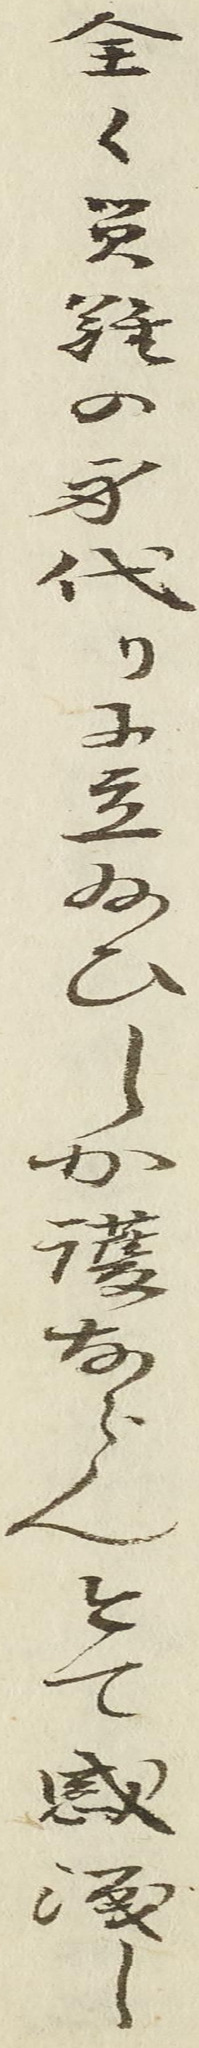全く災難の身代りに立給ひしか護ならんとて感涙し
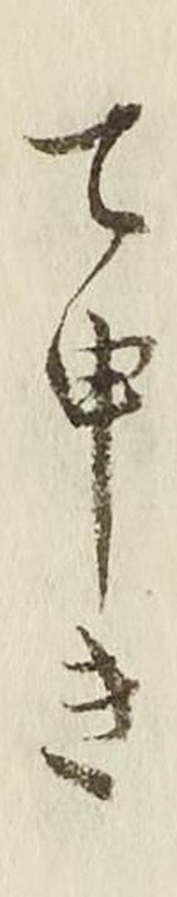て申き
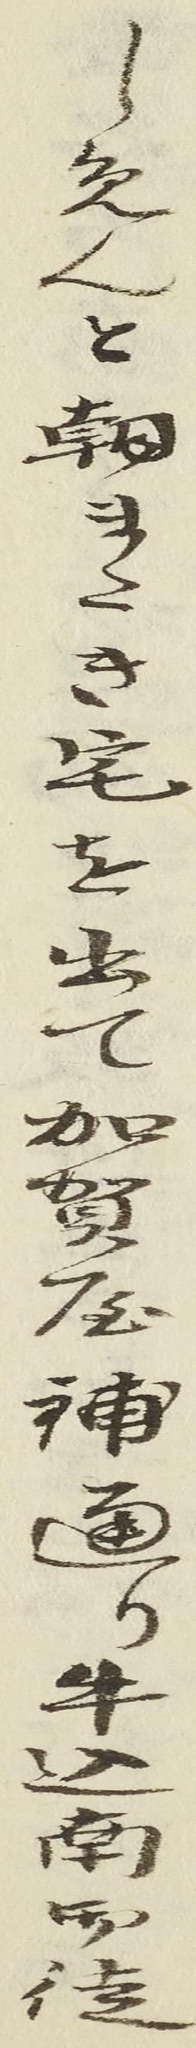しめんと朝またき宅を出て加賀屋鋪通り牛込南御徒
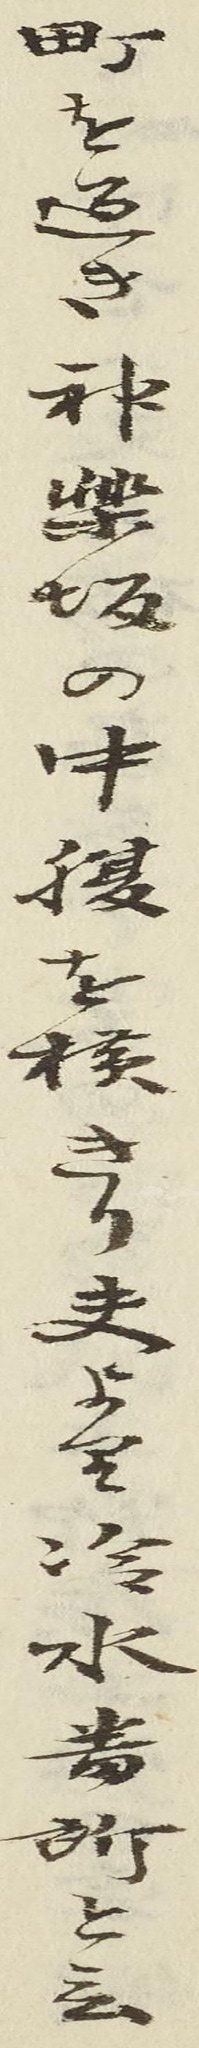町を過き神楽坂の中腹を横きり夫より冷水番所と云
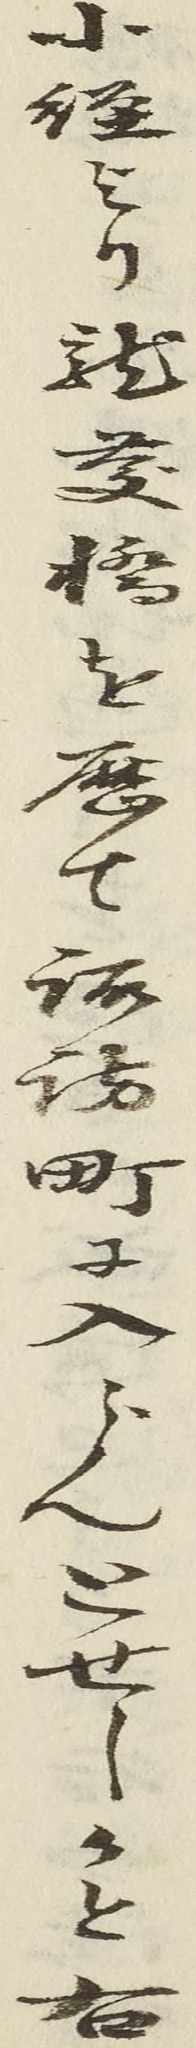小径より竜慶橋を歴て諏訪町に入らんとせしかと右
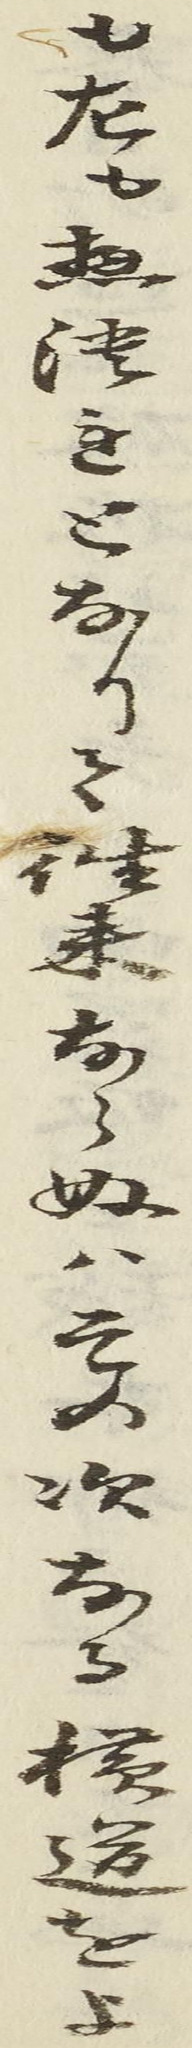も左も惣潰れとなりて往来ならぬハその次なる横道をよ
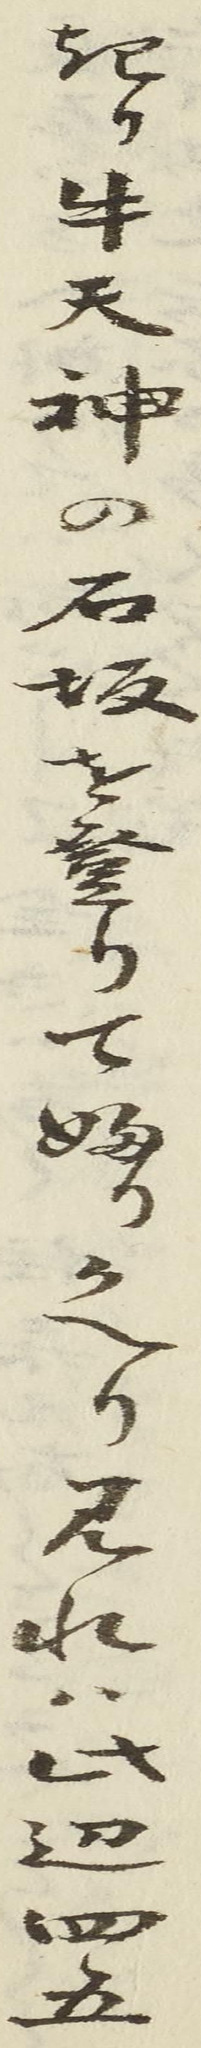きり牛天神の石坂を登りてふりかへり見れハ此辺四五
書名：那為の後見艸　全
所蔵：東京大学地震研究所図書室 Earthquake Research Institute Library, The University of Tokyo, JAPAN
